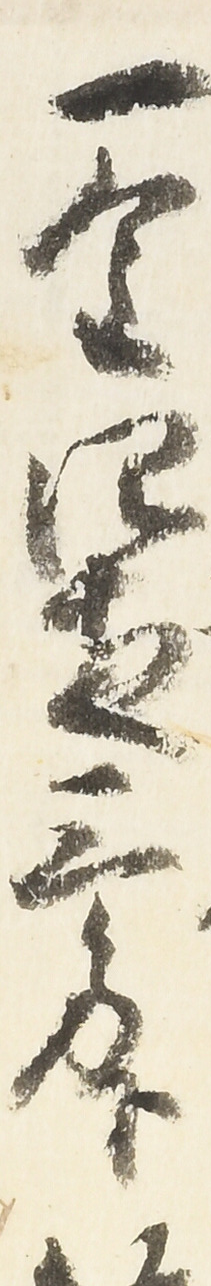〆金四両三分ト
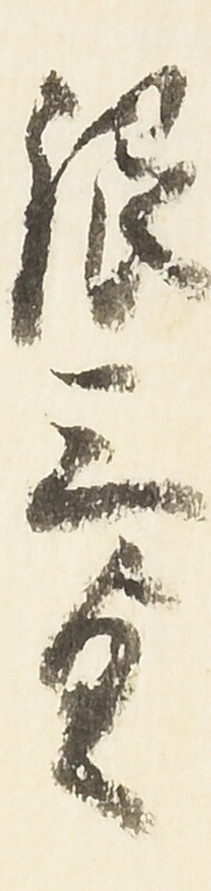銀三匁
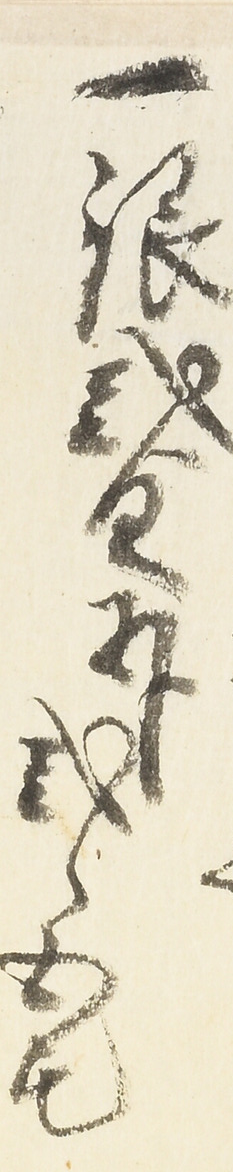一銀弐匁六分弐厘五毛
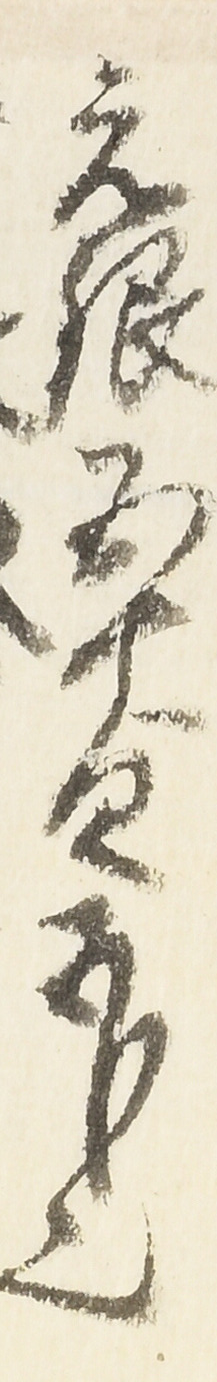元銀五十匁五分也
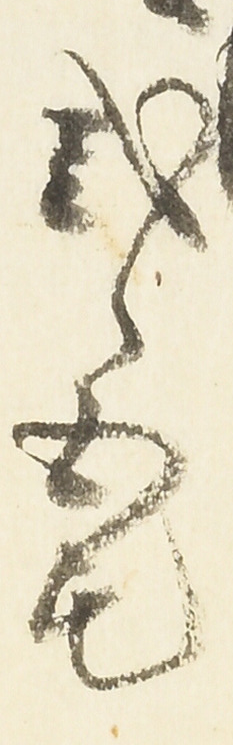弐厘五毛
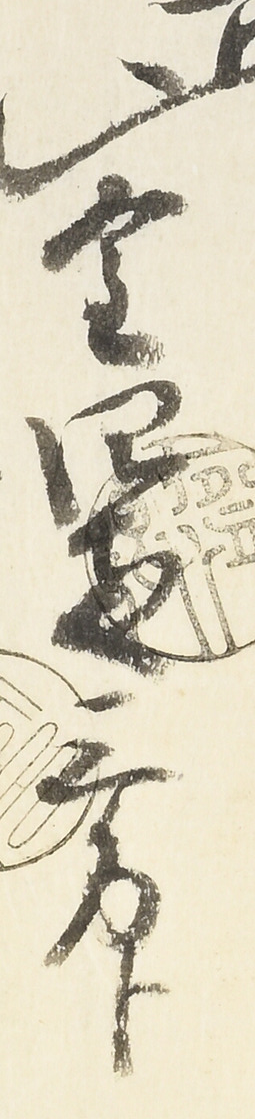〆金四両三分ト
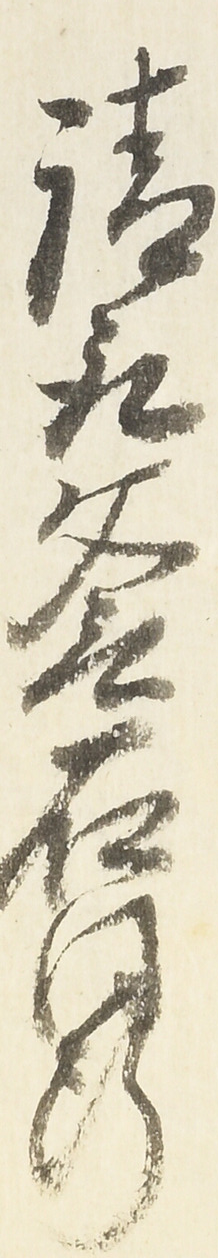請取文言右同断
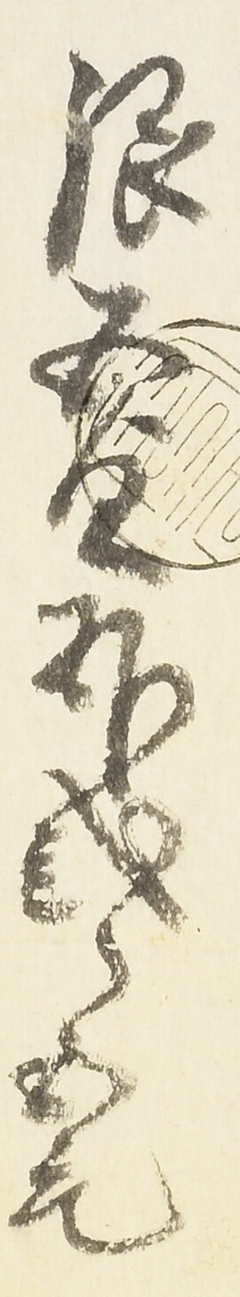銀五匁五分弐厘五毛
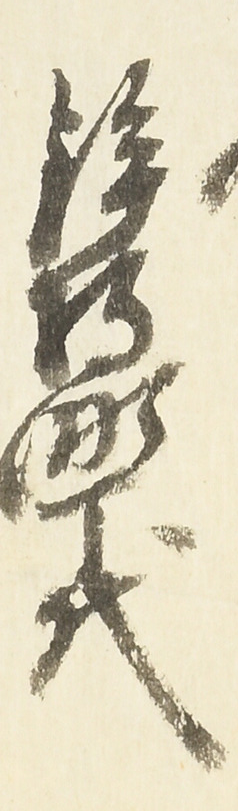鉾持町丁代
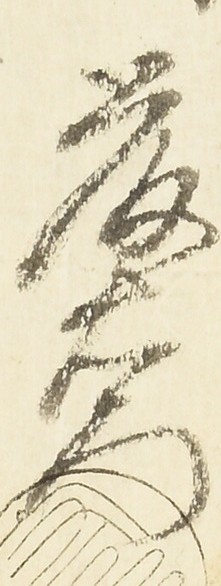藤右衛門

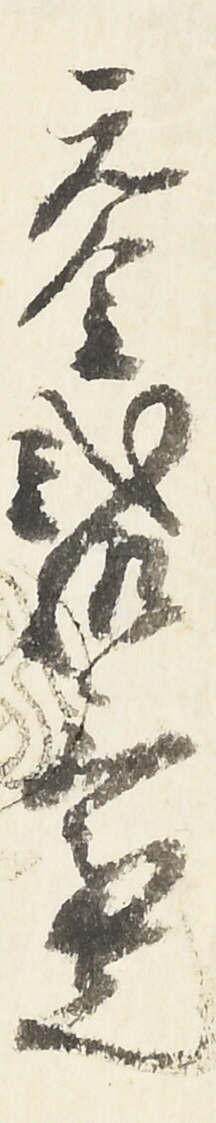元金弐拾三両也
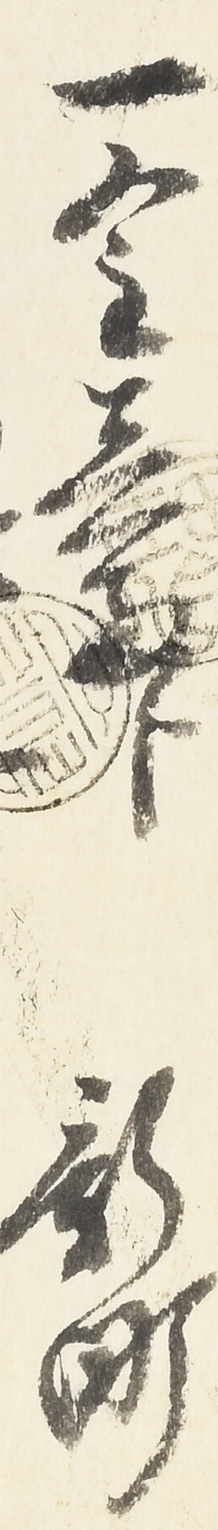一金壱両ト新町
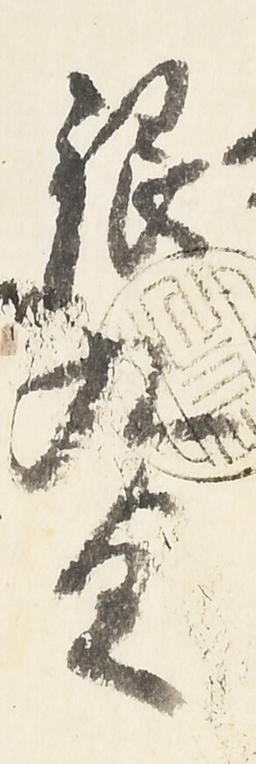銀九匁
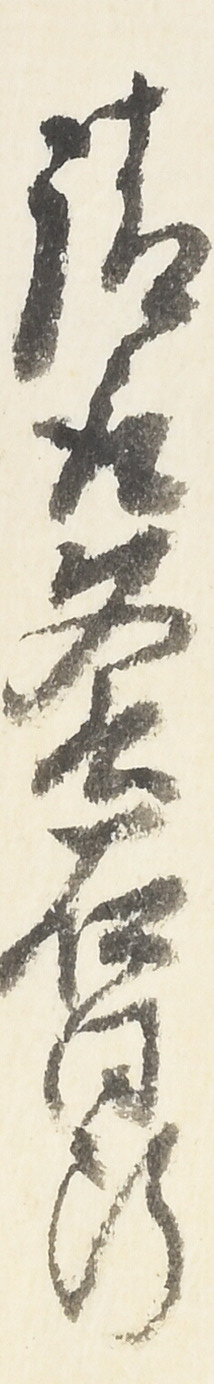請取文言右同断
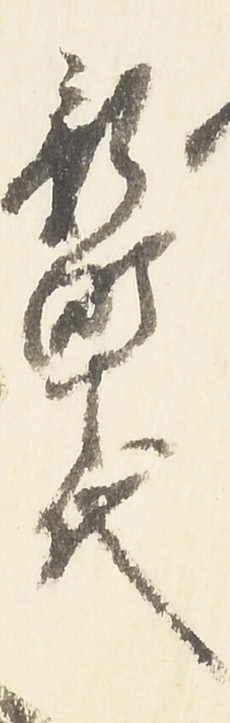新町丁代
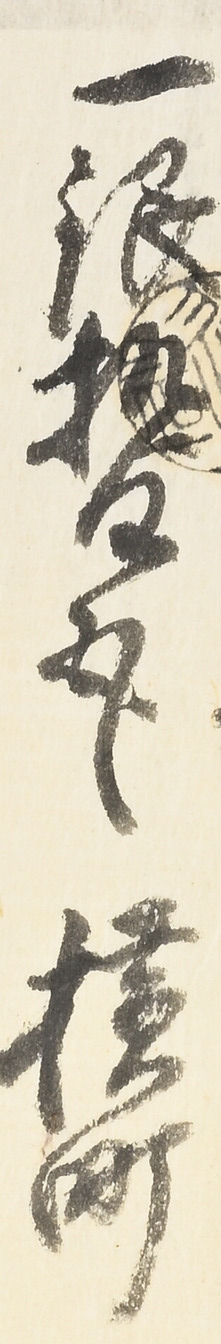一銀拾匁五分横町
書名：御才覚金御利足割渡扣帳
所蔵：伊那市立高遠町図書館・合同会社AMANE
